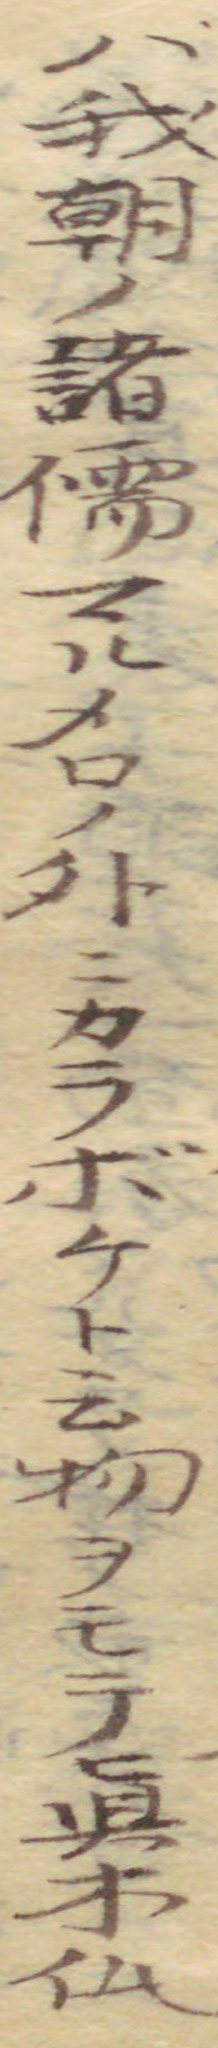バ我朝ノ諸儒マルメロノ外ニカラボケト云物ヲモテ真木瓜
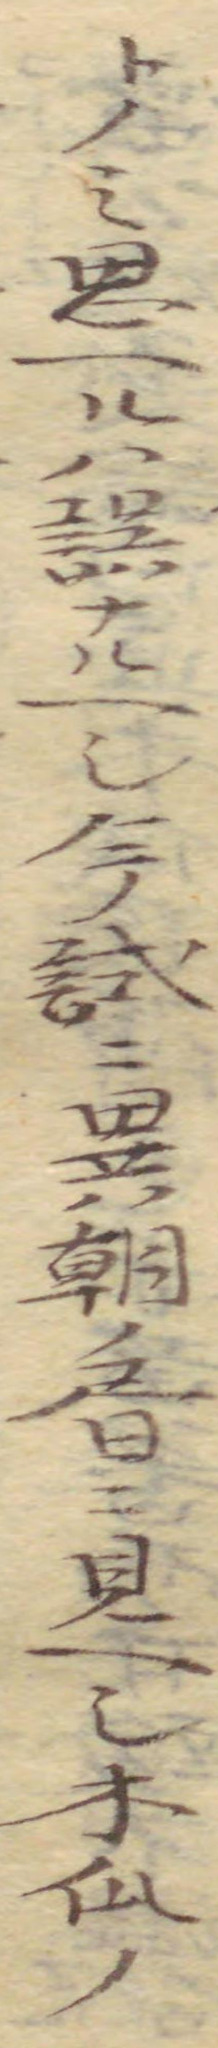トノミ思ヘルハ誤ナルヘシ今試ニ異朝ノ書ニ見ヘシ木瓜ノ
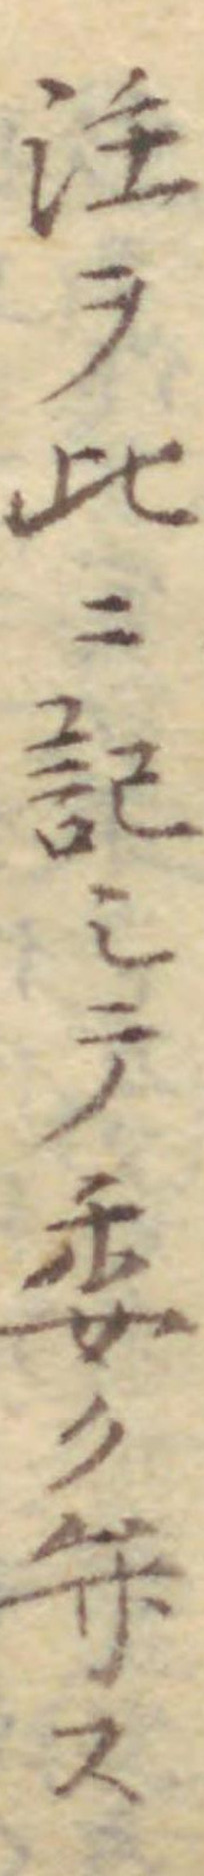注ヲ此ニ記シテ委ク弁ス

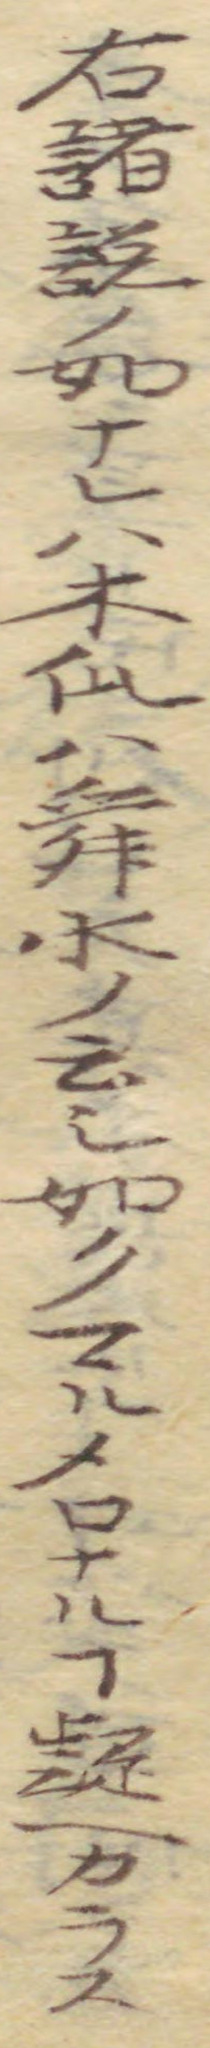右諸説ノ如ナレハ木瓜ハ舜水ノ云シ如クマルメロナルコト疑ヘカラス
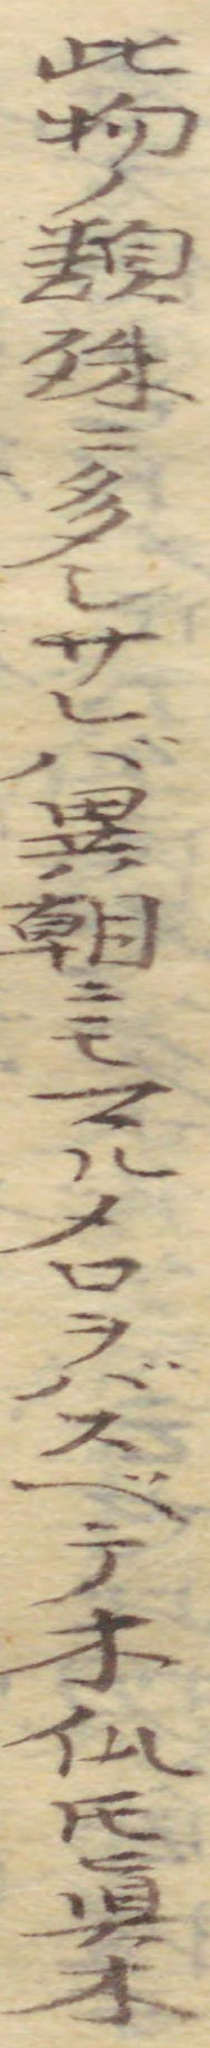此物ノ類殊ニ多シサレバ異朝ニモマルメロヲバスベテ木瓜トモ真木
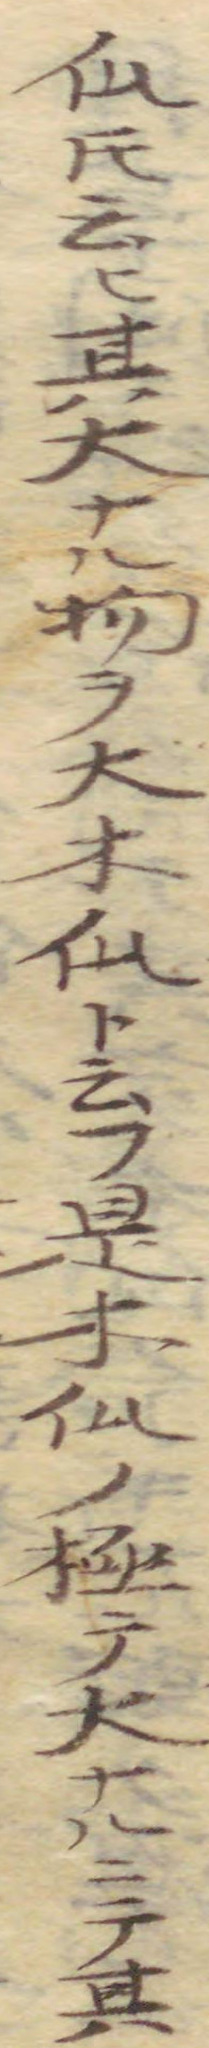瓜トモ云ヒ其大ナル物ヲ大木瓜ト云フ是木瓜ノ極テ大ナルニテ其
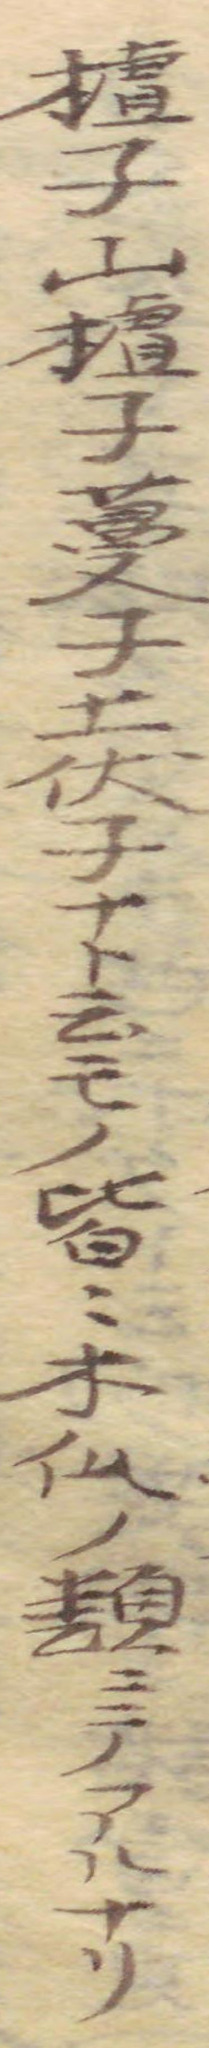樝子山樝子蔓子土伏子ナト云モノ皆〻木瓜ノ類ニテアルナリ
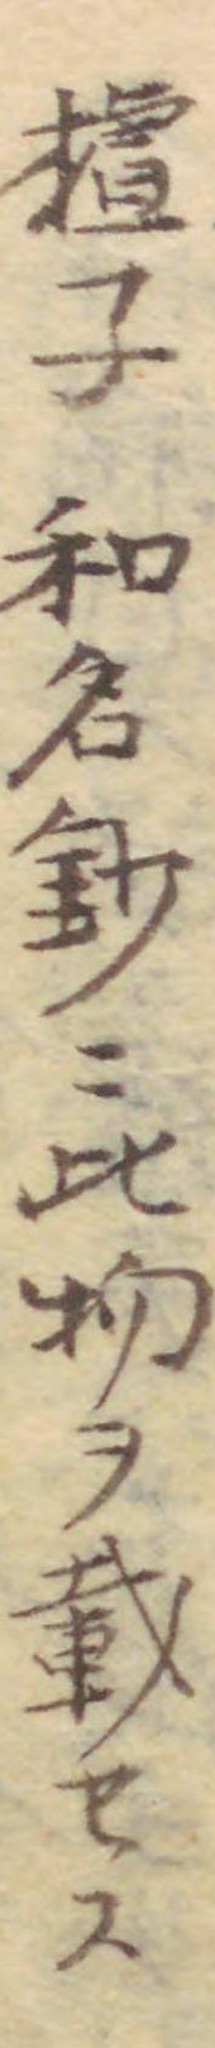樝子和名鈔ニ此物ヲ載セス
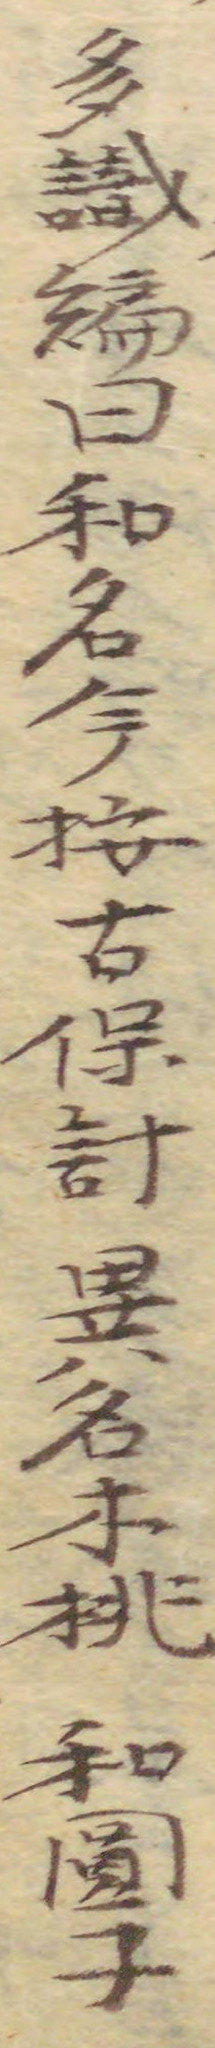多識編曰和名今按古保計異名木桃和円子
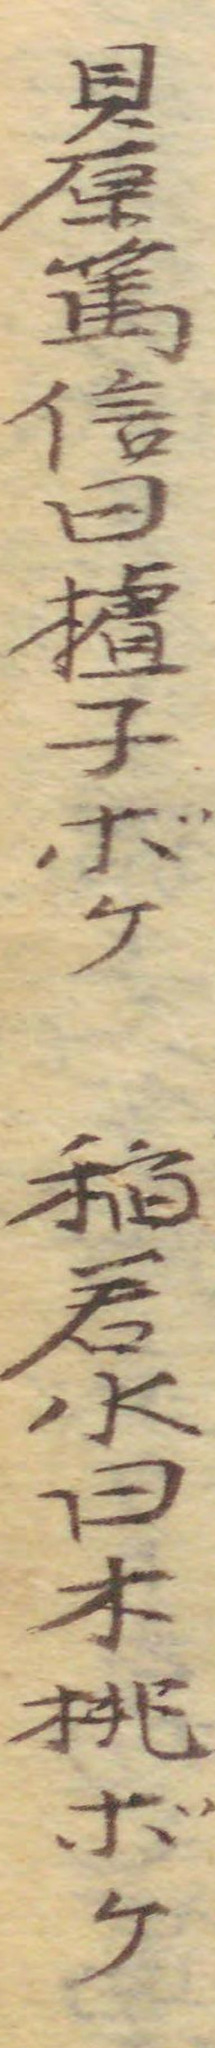貝原篤信曰樝子ボケ稲若水曰木桃ボケ

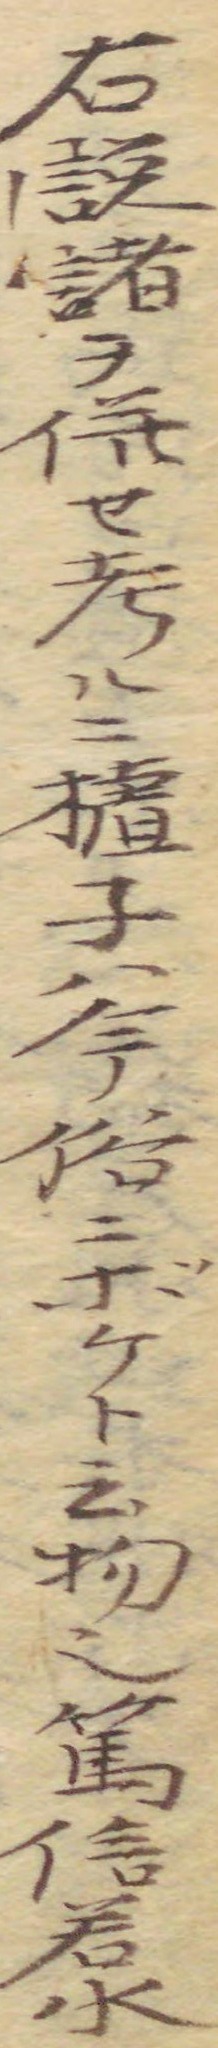右説諸ヲ併セ考ルニ樝子ハ今俗ニボケト云物也篤信若水
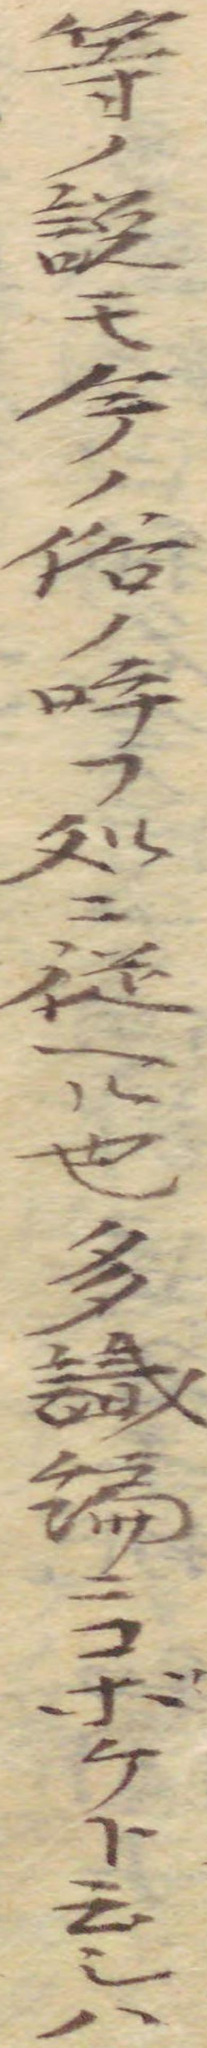等ノ説モ今ノ俗ノ呼フ処ニ従ヘル也多識編ニコボケト云シハ
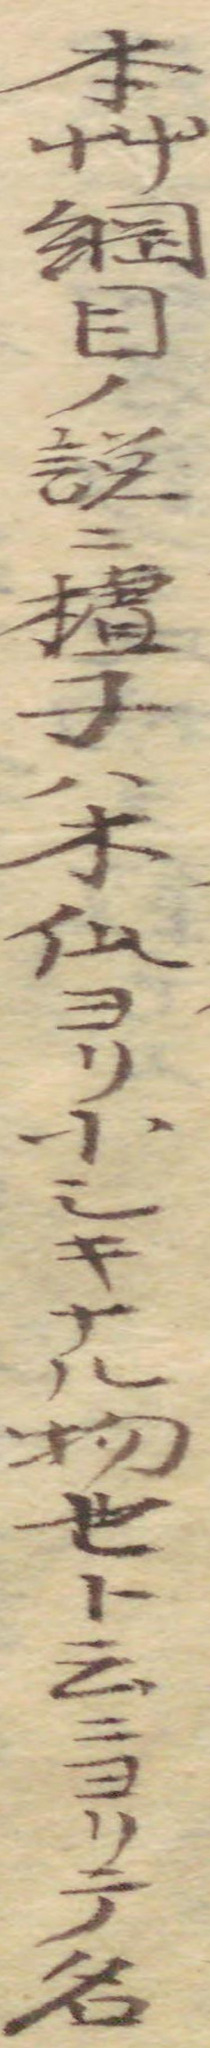本草綱目ノ説ニ樝子ハ木瓜ヨリ小シキナル物也ト云ニヨリテ名
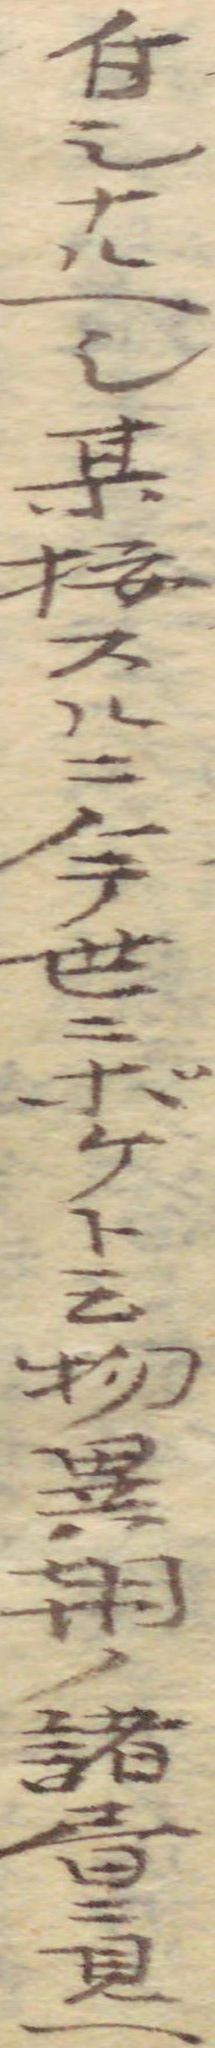付シナルヘシ某按スルニ今世ニボケト云物異朝ノ諸書ニ見ヘ
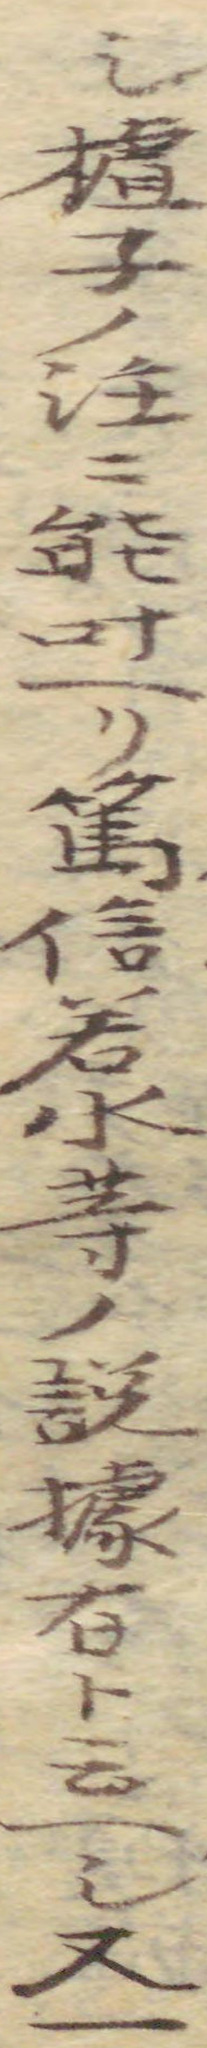シ樝子ノ注ニ能叶ヘリ篤信若水等ノ説拠有ト云ヘシ又一
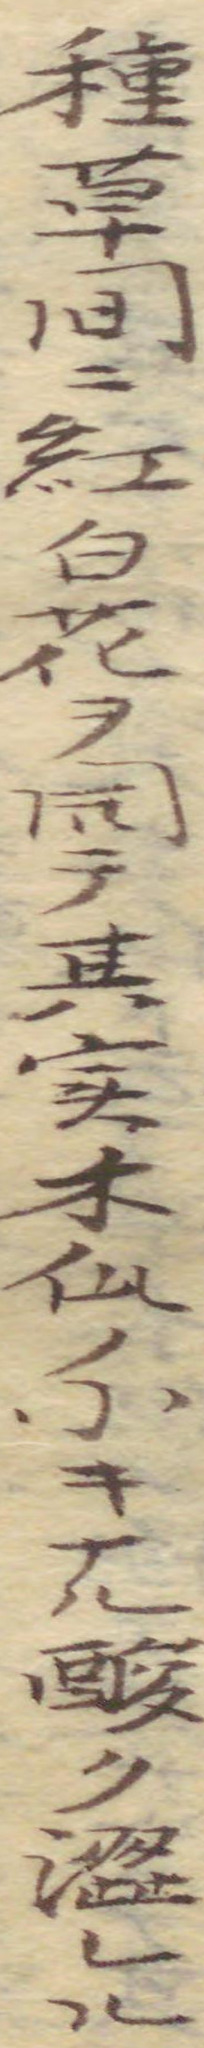種草間ニ紅白花ヲ開テ其実木瓜ノ小キナル酸ク渋レル
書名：鶯宿雑記. 巻263-264
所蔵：国立国会図書館 National Diet Library, JAPAN
